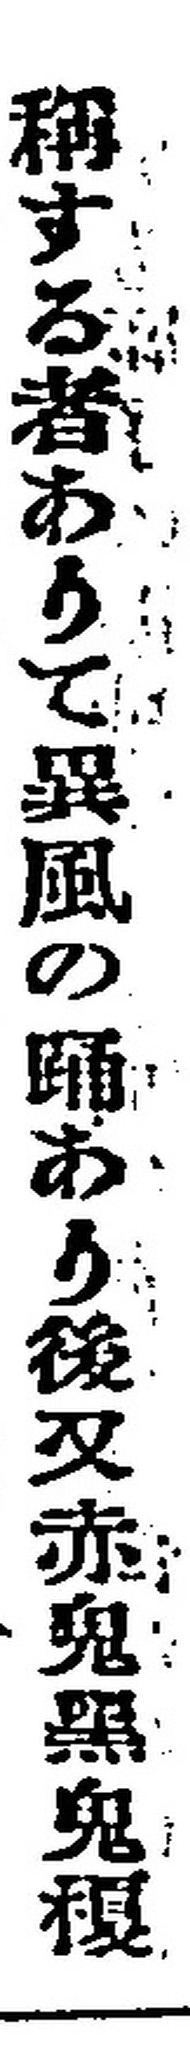称する者ありて異風の踊あり後又赤鬼黒鬼榎
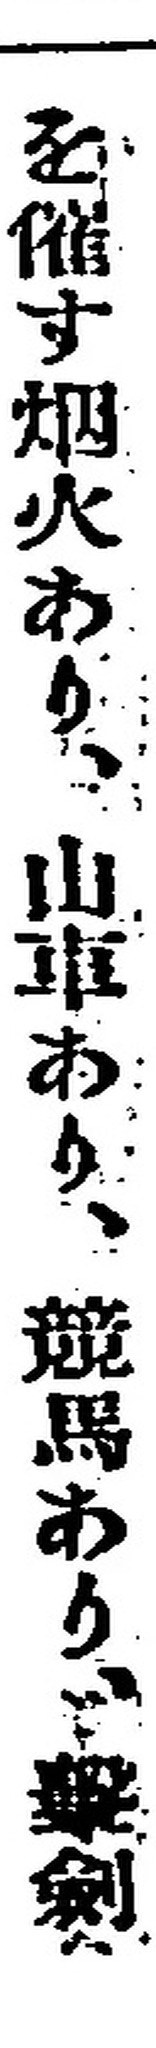を催す烟火あり、山車あり、競馬あり、撃剣
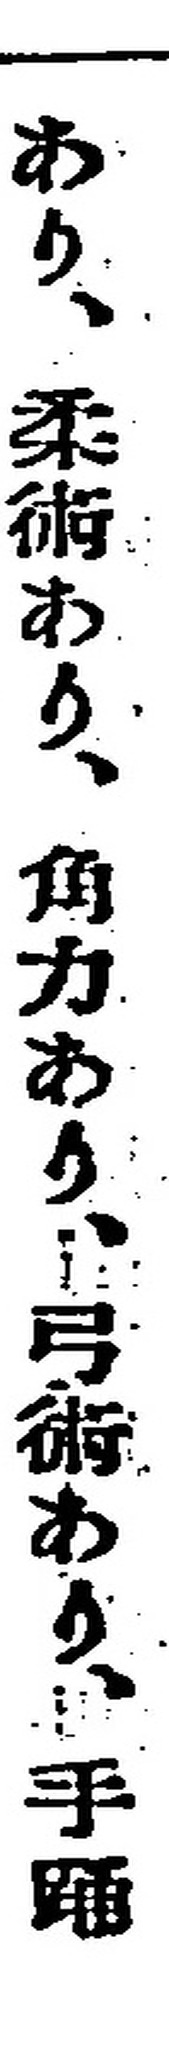あり、柔術あり、角力あり、弓術あり、手踊
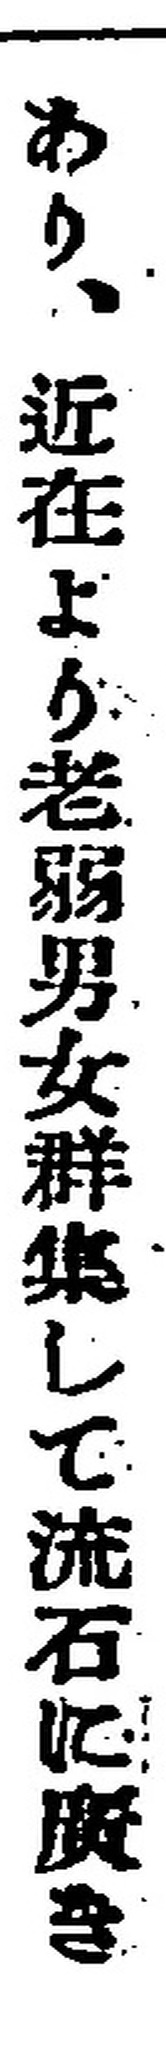あり、近在より老弱男女群集して流石に広き
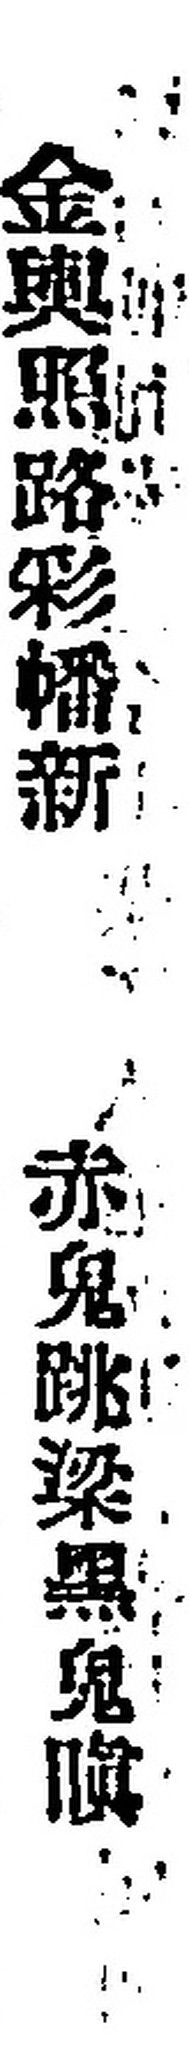金輿照路彩幡新赤鬼跳梁黒鬼瞋
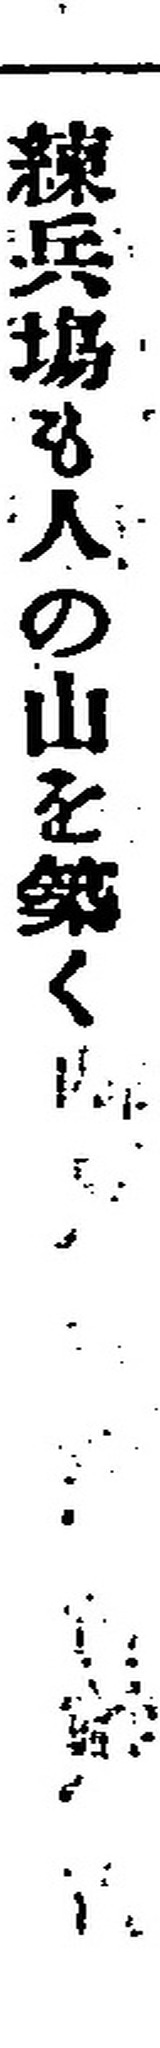練兵場も人の山を築く
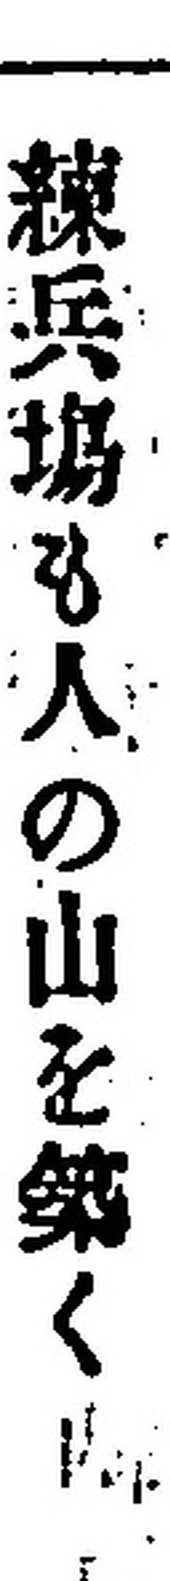練兵場も人の山を築く
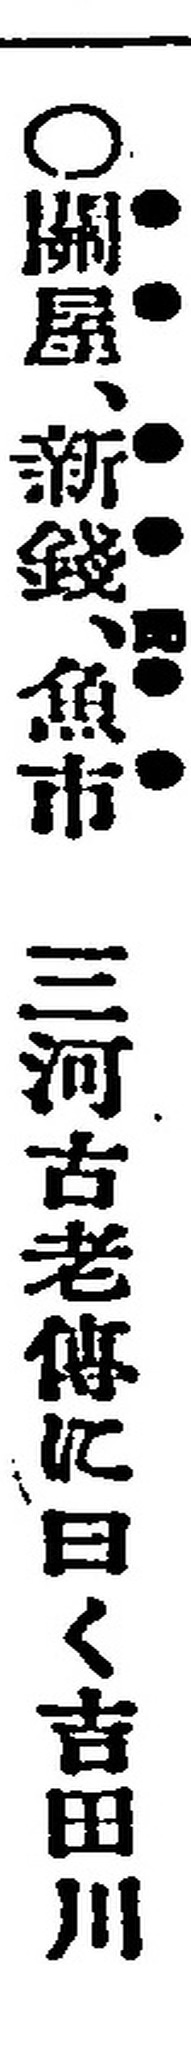○関屋、新銭、魚市三河古老伝に曰く吉田川
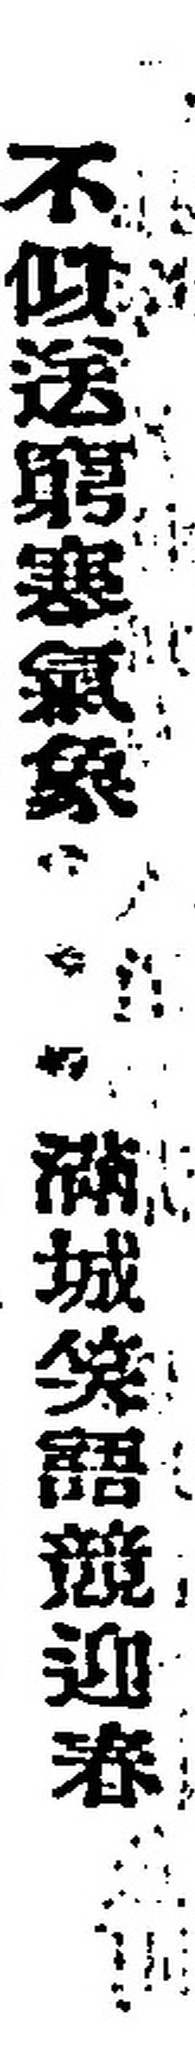不似送窮寒気象満城笑語競迎春
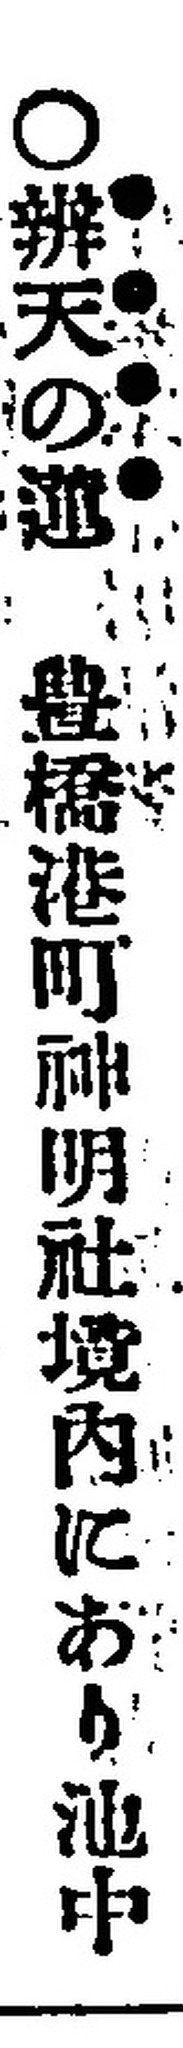○弁天の蓮豊橋港町神明社境内にあり池中
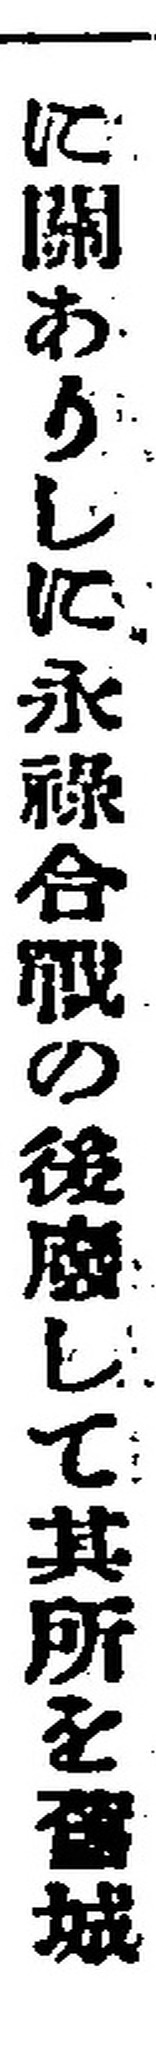に関ありしに永禄合戦の後廃して其所を旧城
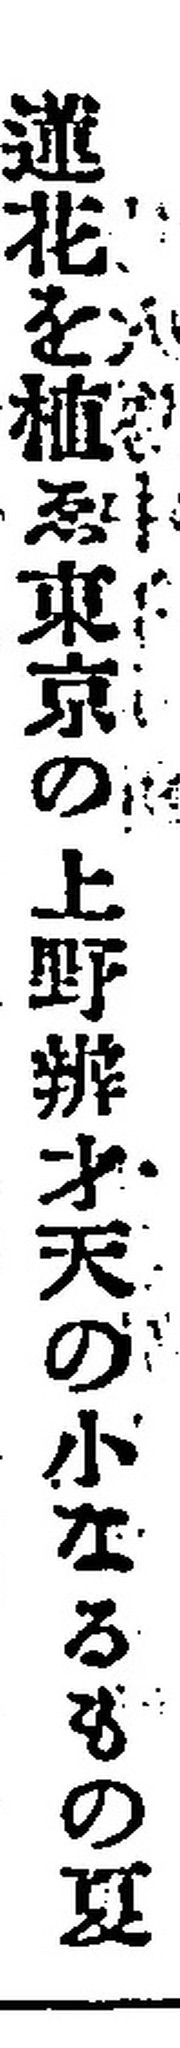蓮華を植ゑ東京の上野弁財天の小なるもの夏
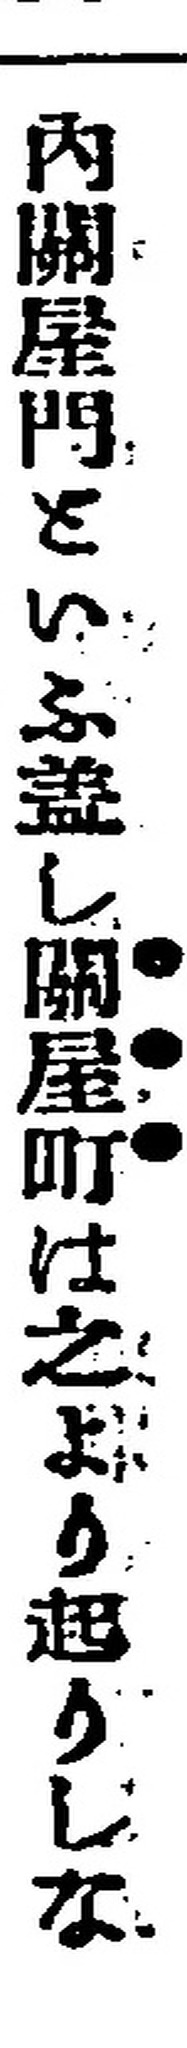内関屋門といふ蓋し関屋町は之より起りしな
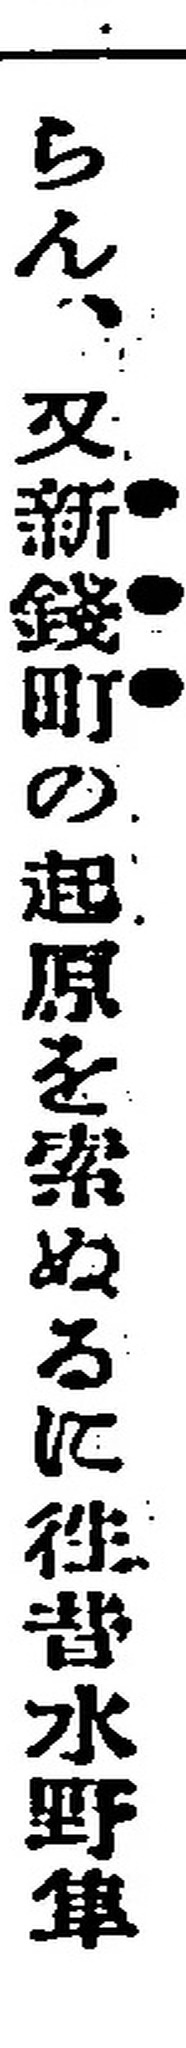らん、又新銭町の起原を索ぬるに往昔水野隼
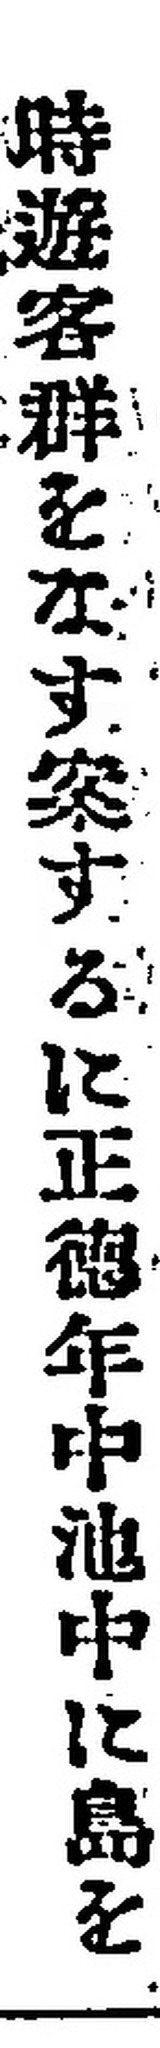時遊客群をなす案するに正徳年中池中に島を
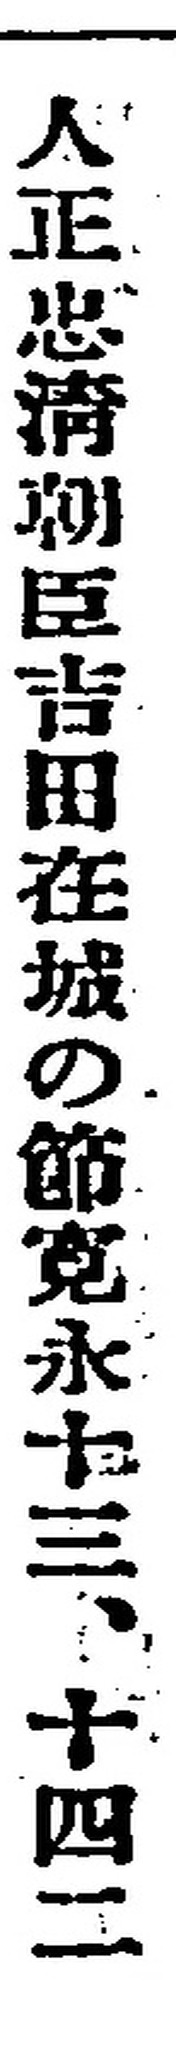人正忠清朝臣吉田在城の節寛永十三、十四二
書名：東参名勝案内
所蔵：国立国会図書館 National Diet Library, JAPAN
